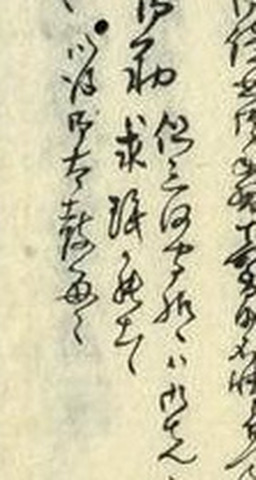求珉罷出候
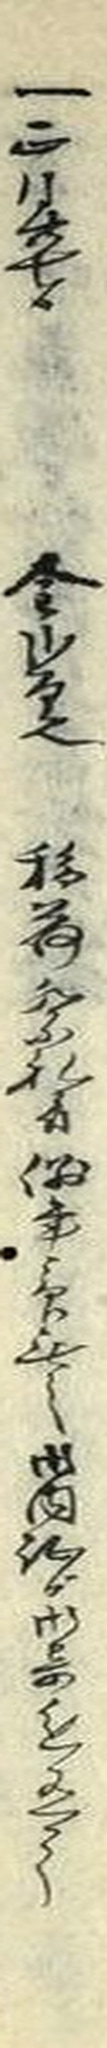一正月廿七日金弐百疋稲荷祭礼ニ付例年ニ而ハ無之御内証ゟ御寄進有之
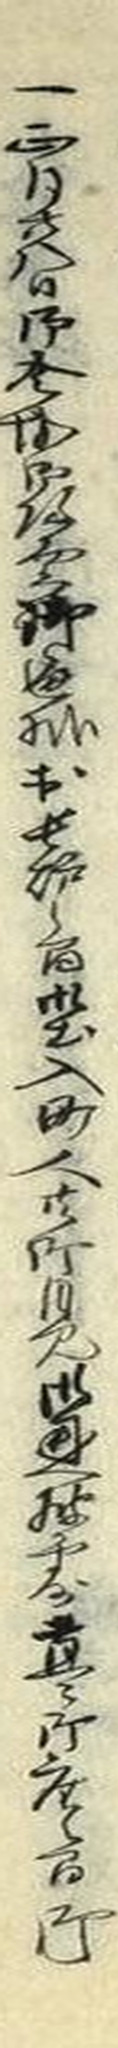一正月廿八日御登城御帰殿通掛於長炉之間御出入町人共御目見御用人披露直ニ御座之間御
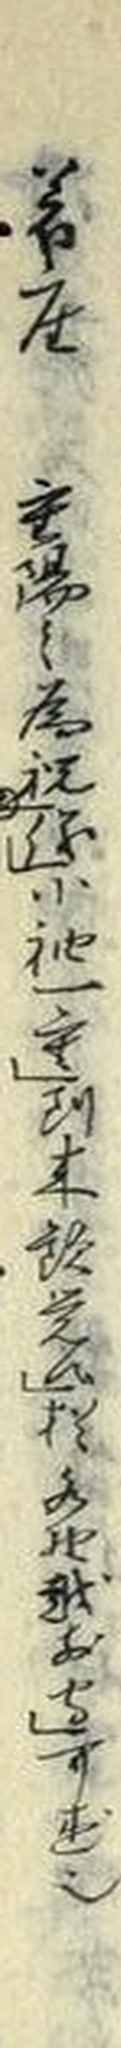着座重陽之為祝儀」小袖一重」到来歓覚候」猶水野越前守」可述也
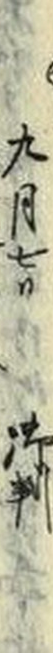九月七日御判

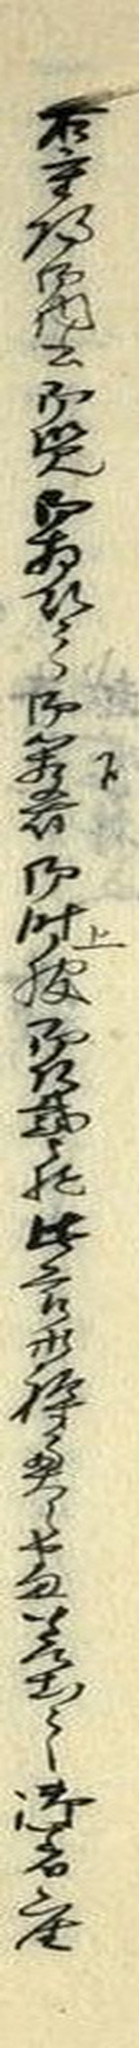右重陽御内書御覧御拝領之御箱肴御時服御頂戴被遊候此節御褥奥之番差出之御着座
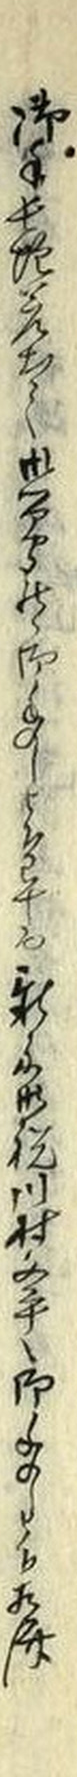御手長鮑差出之御留守居へ御手のし被下畢而新米御祝川村文平へ御手のし被下相済
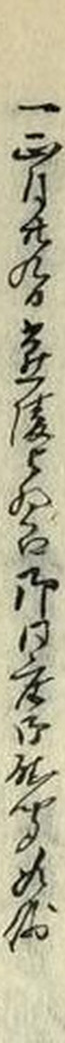一正月廿九日燕凌被為召御同座御聴聞如例
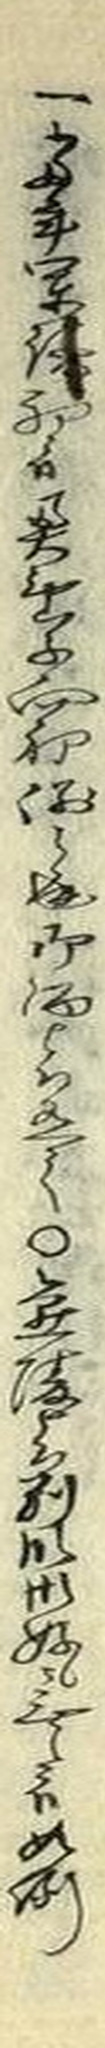一当年軍談初ニ付奥台子初例之通御酒被下有之〇燕凌被下別段御好も無之ニ付如例
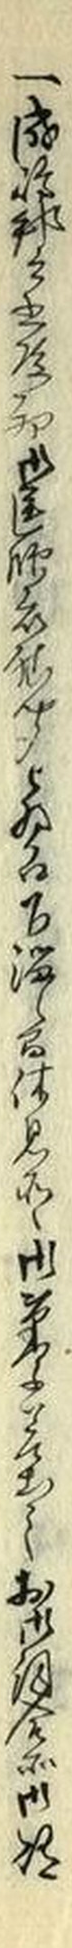一成嶋邦之丞殿初御医師衆聴聞被為召下溜之間休息所へ御菓子差出之於御調合所御賄
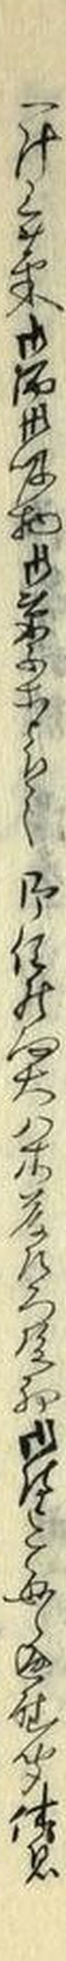一汁三菜御酒御吸物御菓子等被下之御住居向大八木藤左衛門殿初御侍迄毎之通聴聞休息
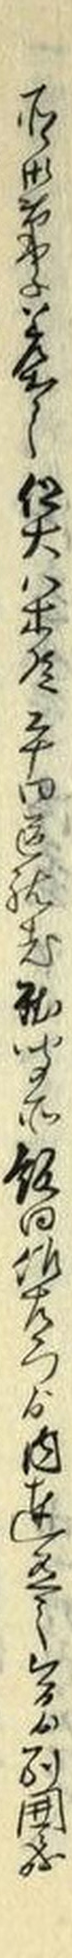所へ御菓子差出之但大八木殿平田道祐老聴聞所飯田作左衛門ゟ内達有之今日ゟ別囲ニ成
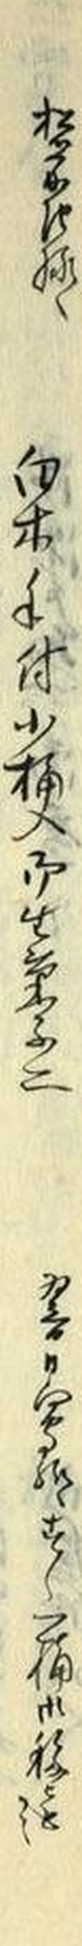松栄院様へ白木手付小桶入御生菓子二翌日日向守様へすし一桶御移被進之
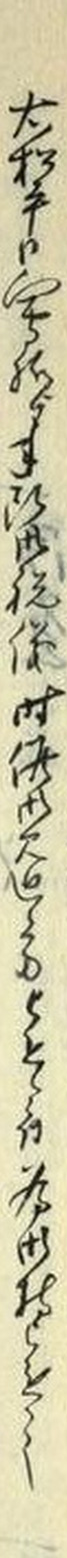右松平日向守様ゟ年頭御祝儀時候御見廻方被進候ニ付為御持被進之
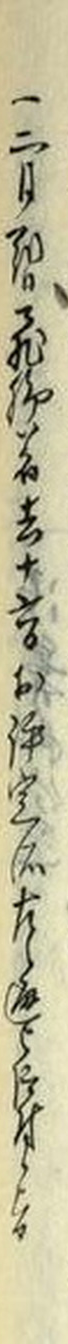一二月朔日飛脚着去十六日於評定所左之通被仰付候旨
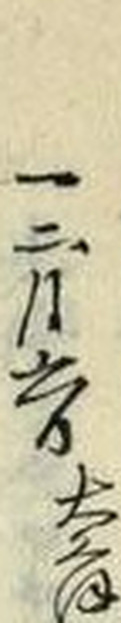一二月六日
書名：少傅日録抄（斉善付側向頭取日記、在府）
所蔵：福井県文書館 Fukui Prefectural Archives
